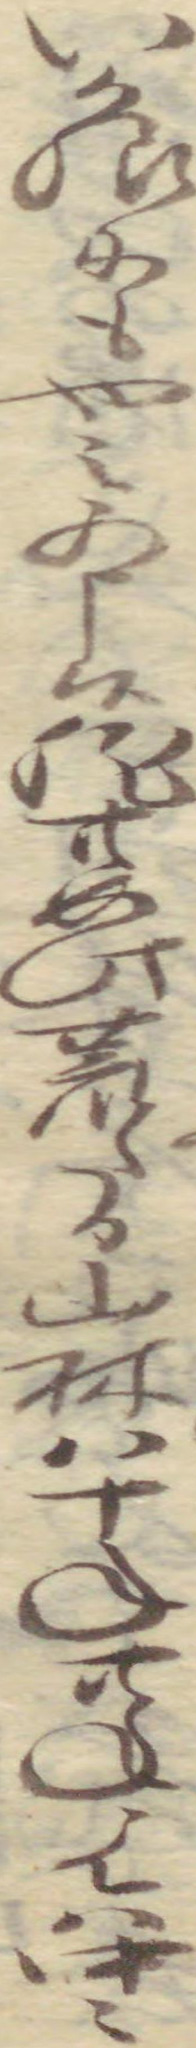いか様にもやみ可申候然共如此荒たる山林は十年廿年ニては中〻
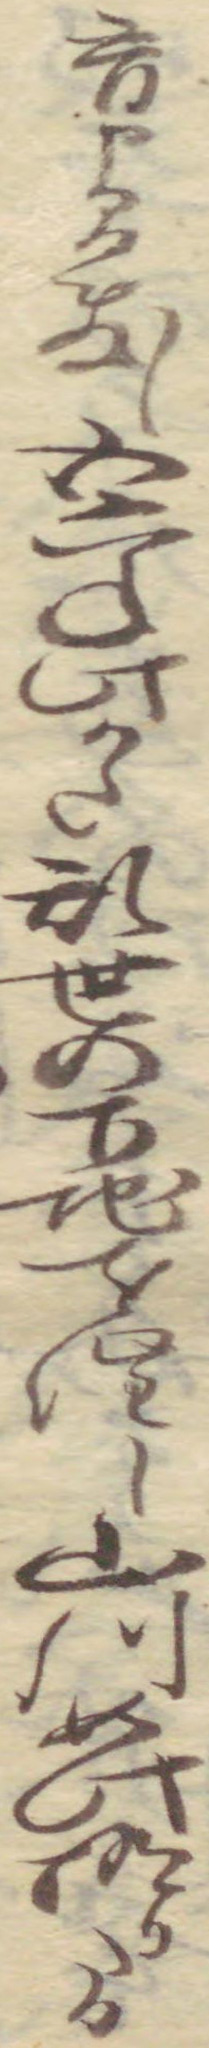育申間敷候五六年此かた乱世の下地を催し山川如此極りたる
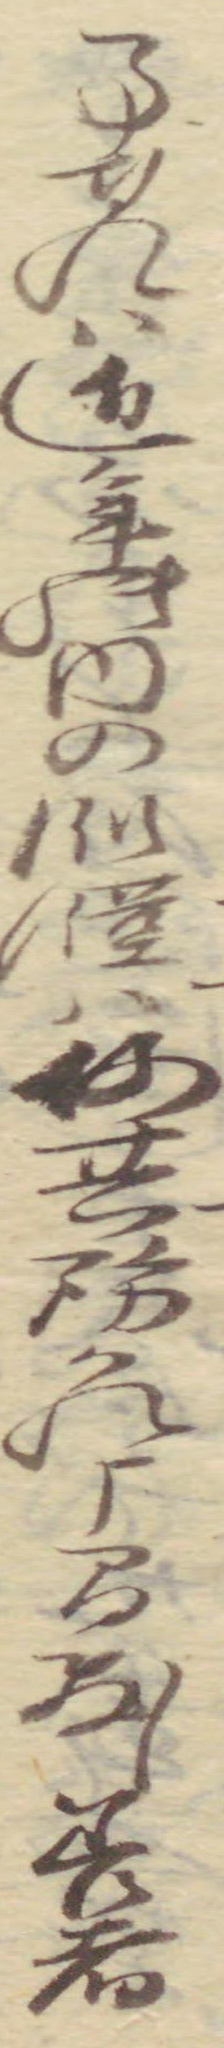事なれは近年の内の飢饉は何共防かれ申間敷候善者
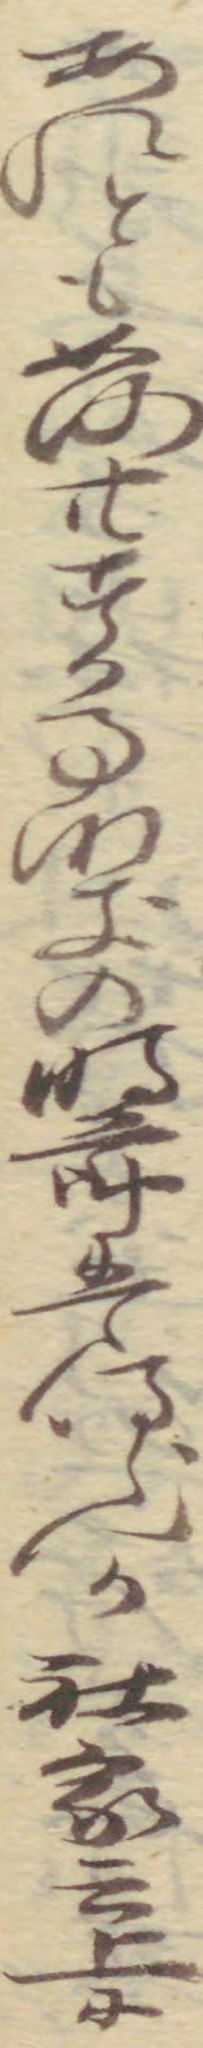あれとも如何共する事なきの時節にて侍らんか社家云上に
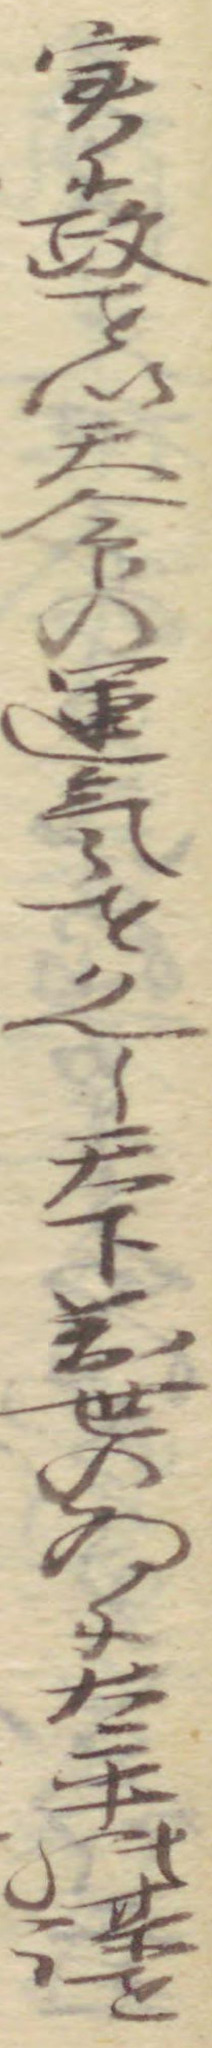実に政を以天命の運気をかへし天下万世の為に太平の謀を
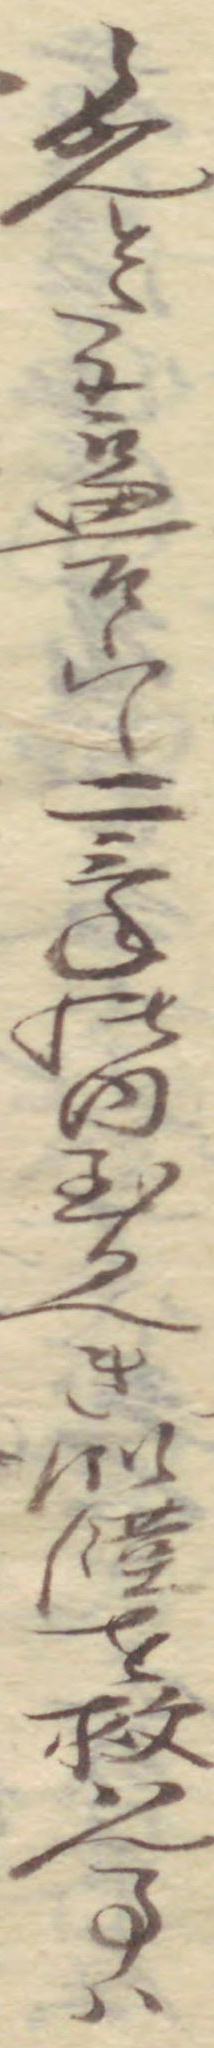被成んとたに被思召候はゝ二三年の内至るへき飢饉を救はん事は
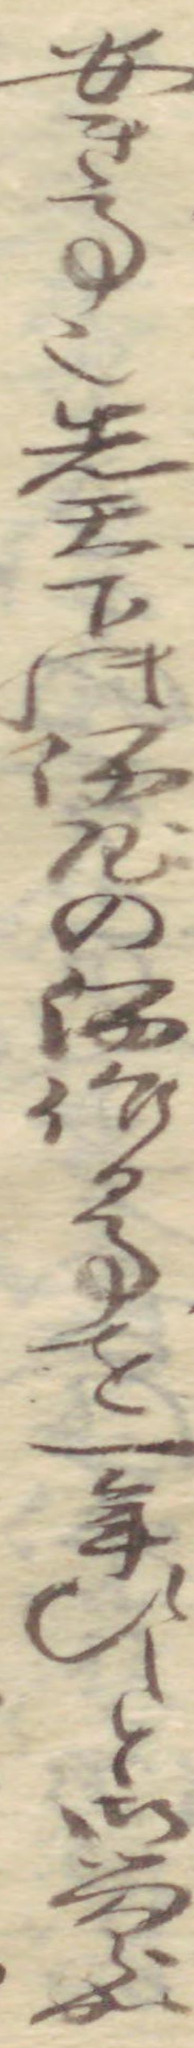安き事也先天下の酒屋の酒作る事を一年ひしと御留被成
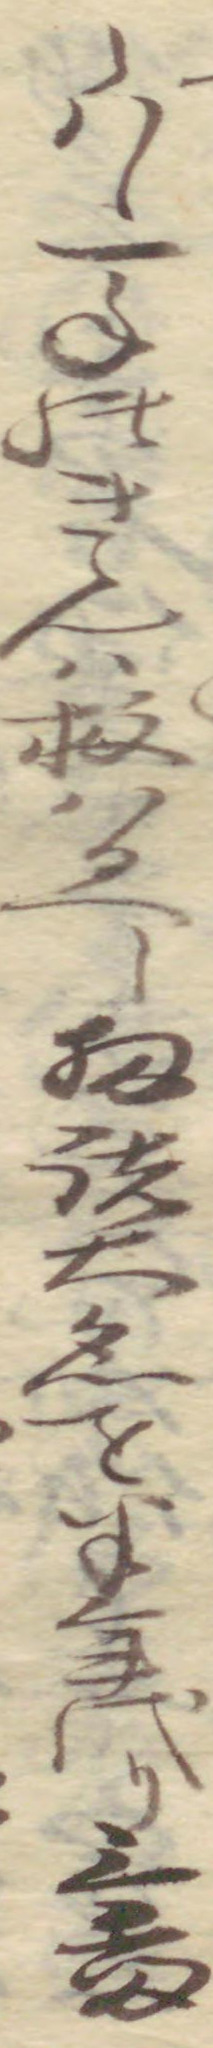候はゝ一年のきゝんは救はるへし扨諸大名を半年代り三番
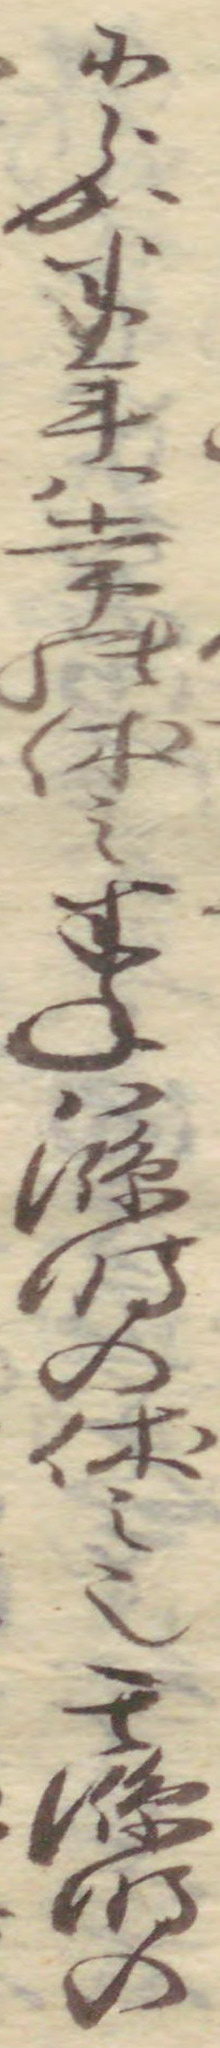に被成半年は常の休み半年は臨時の休み也其臨時の
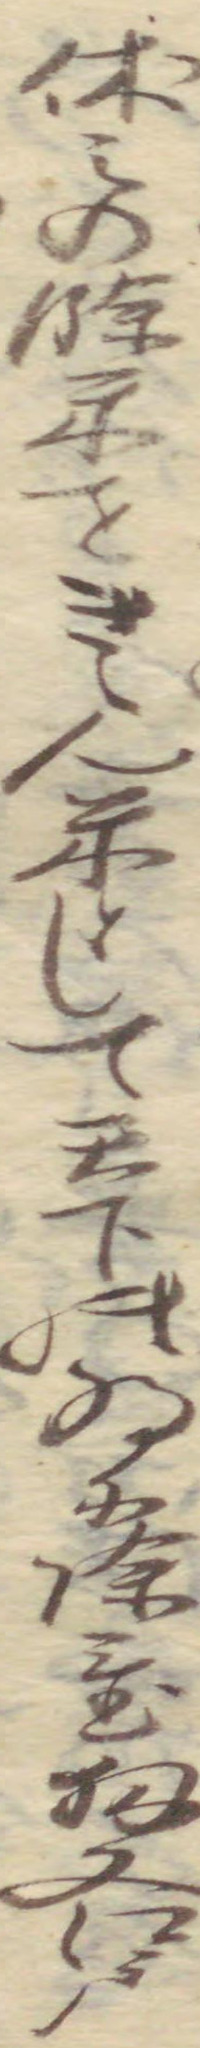休みの余米をきゝん米として天下の為に除置扨又江戸
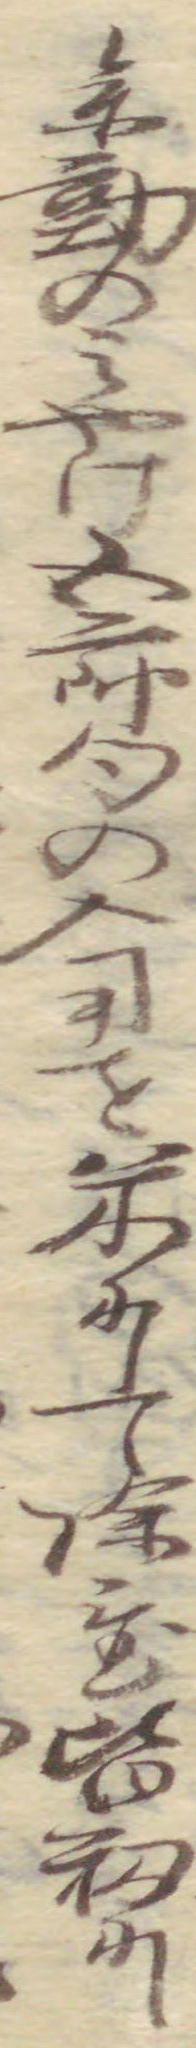参勤のみやけ五節句の入用を米にして除置皆籾にし
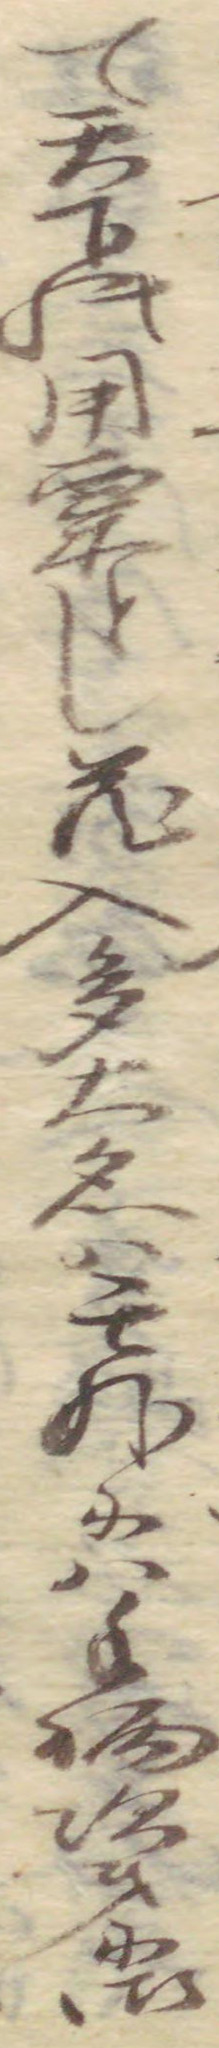て天下の用粟？とし蔵入多大名は其外には手柄次第に御
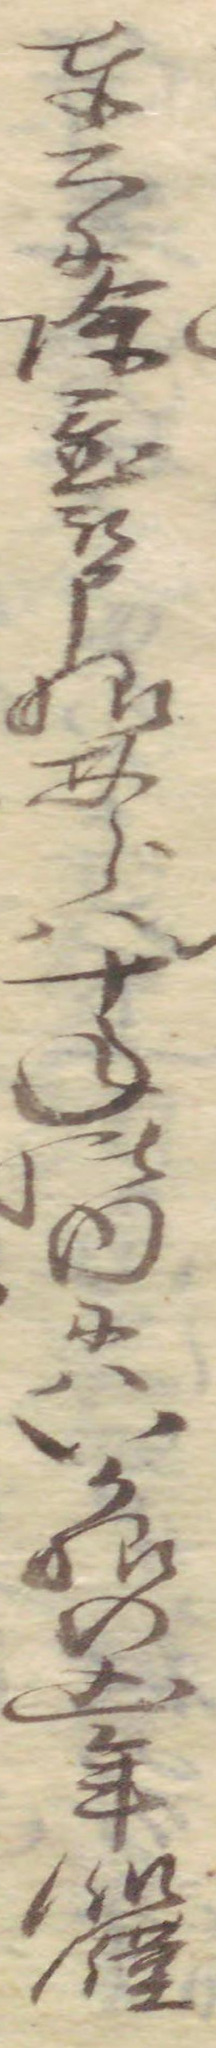奉公に除置被申様ならは十年の内にはいか様の凶年飢饉
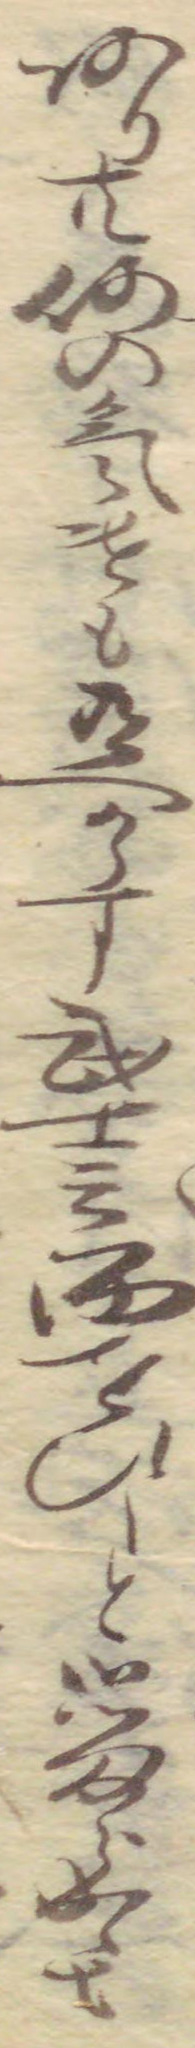あり共何の気遣も有へからす武士云酒をひしと御留被成候は
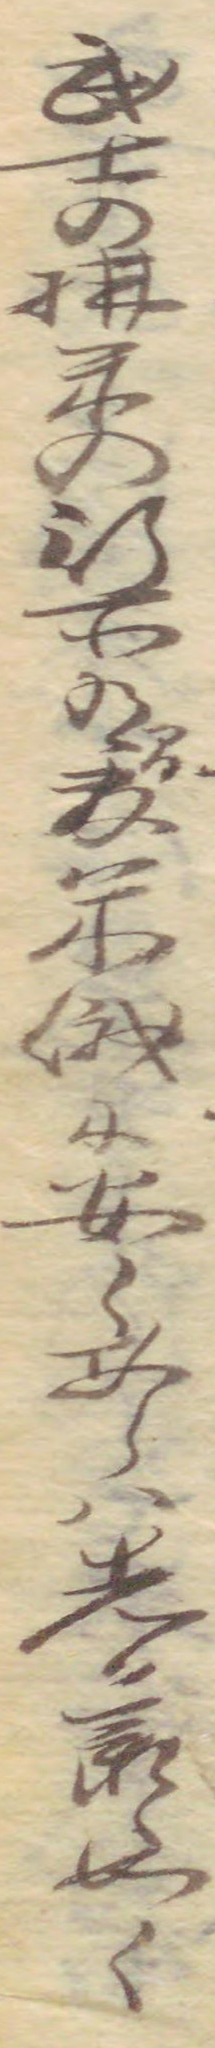武士の払米の行処有間敷米俄に安くならは先日承候如く

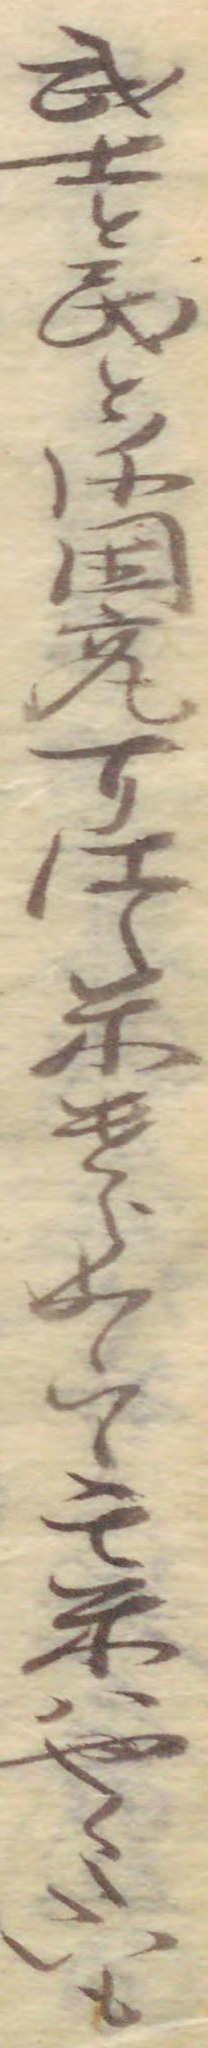武士と民と弥困窮可仕候米遣被成候はゝ其米はやくたいも
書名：鶯宿雑記. 巻263-264
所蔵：国立国会図書館 National Diet Library, JAPAN
